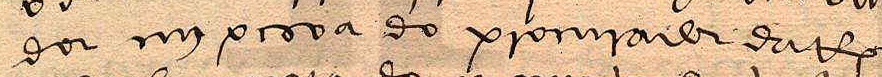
dor em pesoa do procurador da Rꝭ
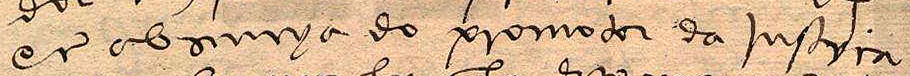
e ē absencya do promotor da Justiça
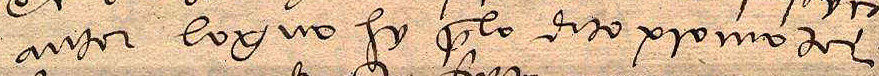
autor loguo hy p̄lo dito promotor
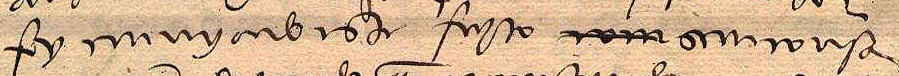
foy emuyado este feyto com sem cousa
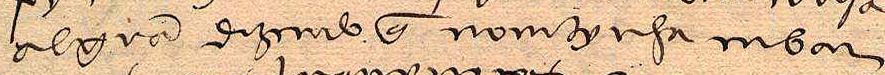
alguā dizendo q̄ nom tynha enbar
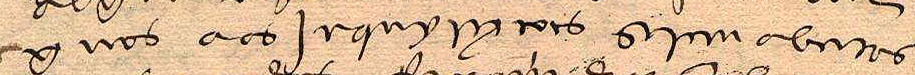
guos aas Jnquyryções serem abertas
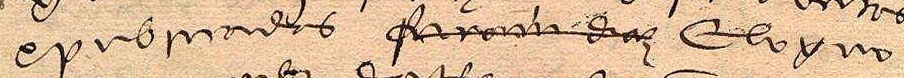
e pubricadas fernam diaz E loguo
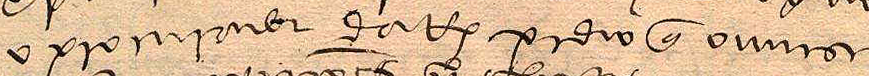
o procurador da Rꝭ pedio q̄ ouuese
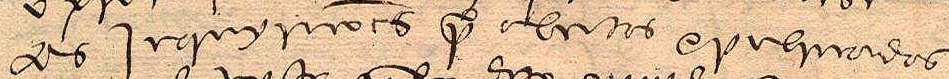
tas Jnquyrições p̄o abertas e pubricadas
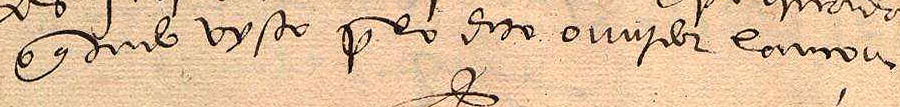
o q̄ tudo vysto p̄lo dito ouujdor lançou
